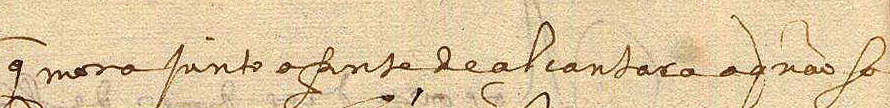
q̄ mora junto a ponte de alcantara a q̄ não sa
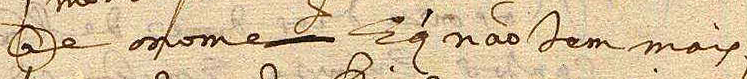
be o nome E q̄ não tem mais
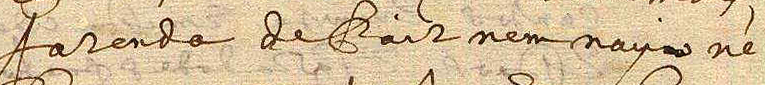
fazenda de Raiz nem naujo nē
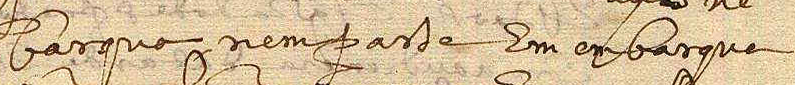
barqua nem parte Em embarqua
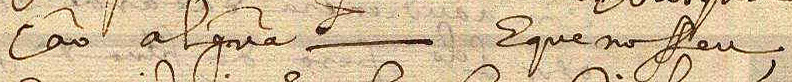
caõ algūa E que no sseu
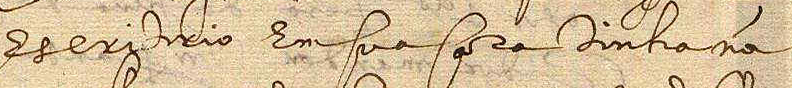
Escritorio Em sua Caza tinha no
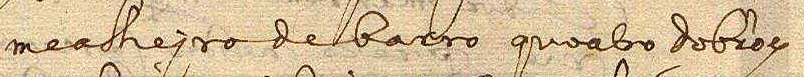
mealhejro de barro quoatro dobrões
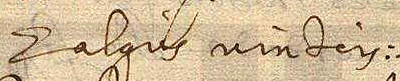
E algus̄ uinteis
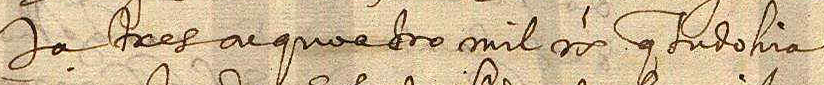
ta tres ou quoatro mil rs̄ q̄ tudo hia
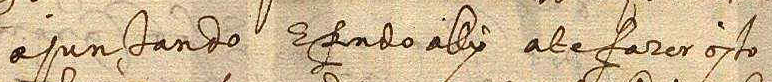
ajuntando E pondo ally ate fazer ojto
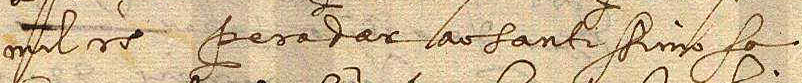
mil rs̄ pera dar ao santissimo sa
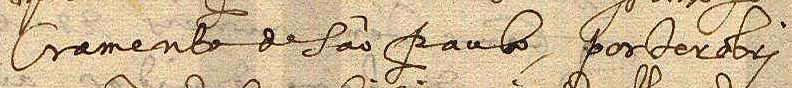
Cramento de saõ paulo, por ter obrj
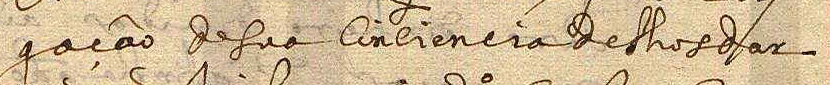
gação de sua conciencia de lhos dar
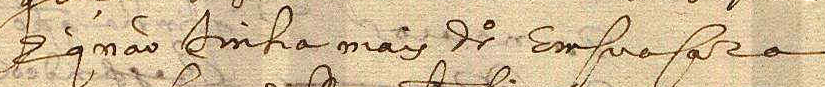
E q̄ não tinha mais dro em sua Caza
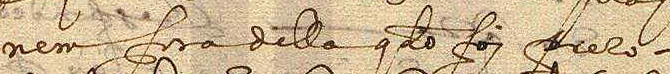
nem fora della qd̄o foj prezo
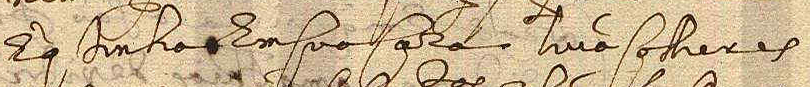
E q̄ tinha Em sua Caza huā Colheres
